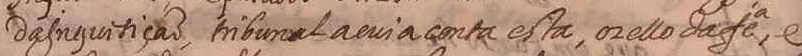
da Jnquisiçaõ, tribunal a cuia conta esta, o zello da fê, e
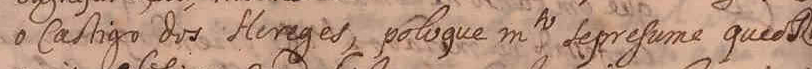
o Castigo dos Hereges, polo que mto se presume que o R
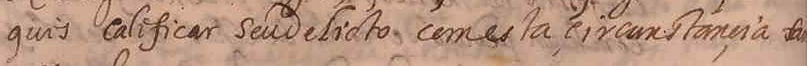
quis calificar seu delicto com esta circunstancia ta
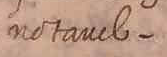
notauel.
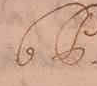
6 P
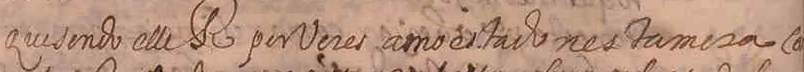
Que sendo elle R por Vezes amoestado nesta meza co
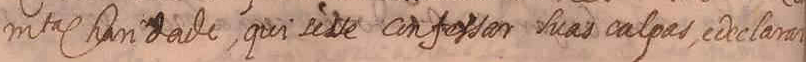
mta Charidade, quisesse confessar suas culpas, e declarar
